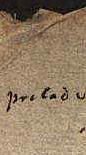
prelado
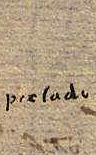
prelado
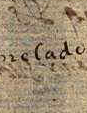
prelado
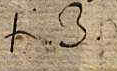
+ 3o.
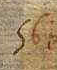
56
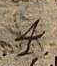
4
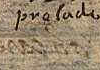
prelado
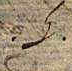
.5.
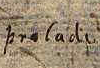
prelado
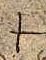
+
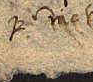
p̄o mat
